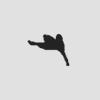又
